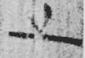止（趾）
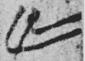亡
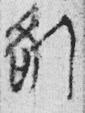咎
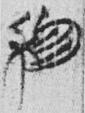利
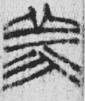羕（永）
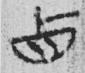貞
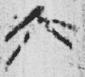六
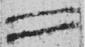二
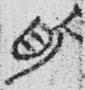艮
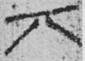亓（其）
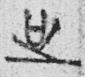足
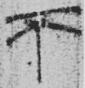不
